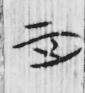正
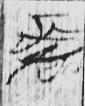差
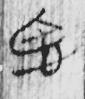思
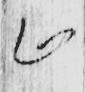㠯（以）
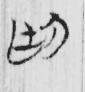○（廷）
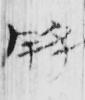阩
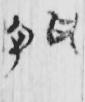門
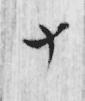又
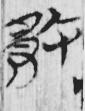敗
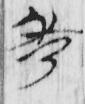秀
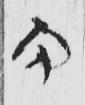免
